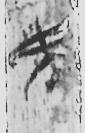民
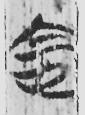{宀𠁩}（仲）
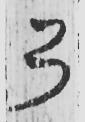乃
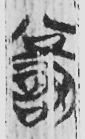罰
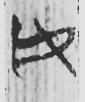女
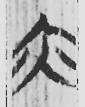亦
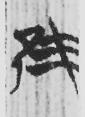隹
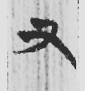又
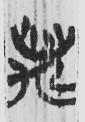萬
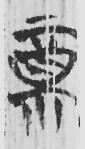福
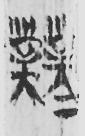{菐菐}=
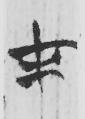才
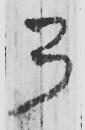乃
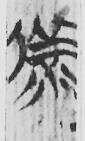備
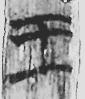王
